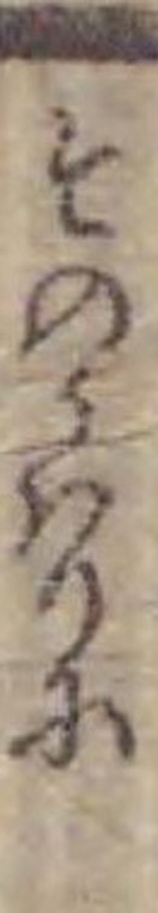そのかはりに
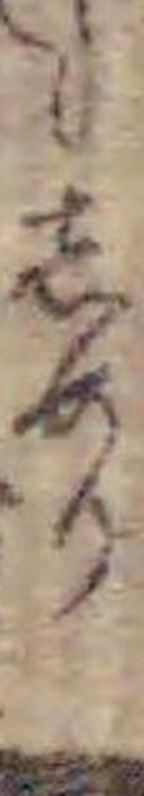しめり
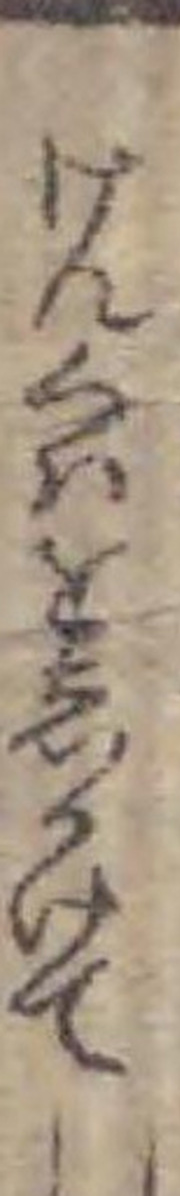けんくはをしかけて
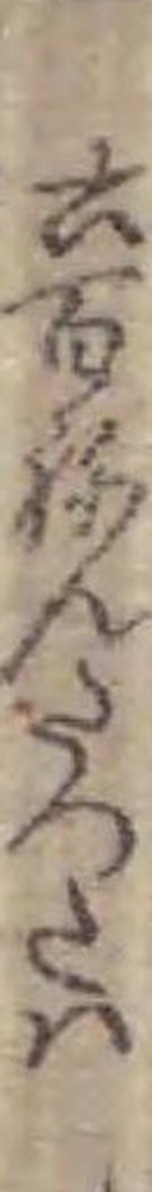六百ねんたつたは
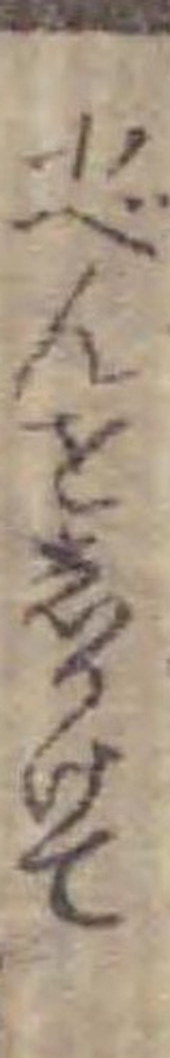小べんをしかけて
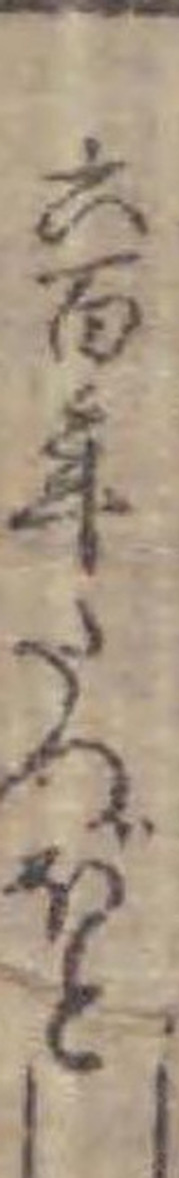六百年たつぼと
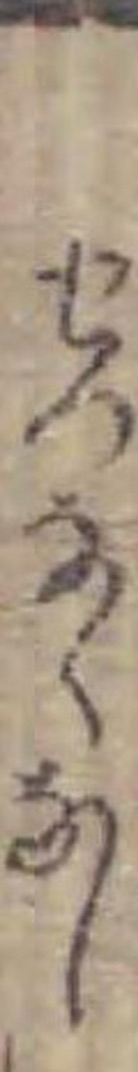せつなくなし
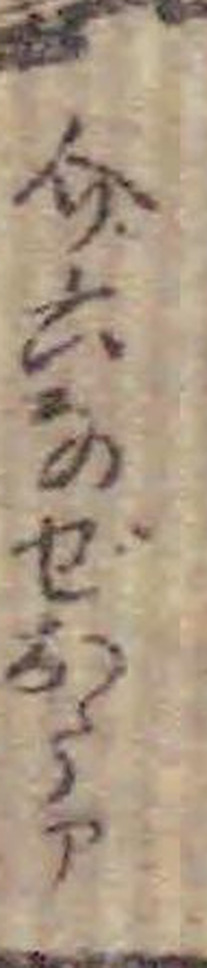介六なぜおら
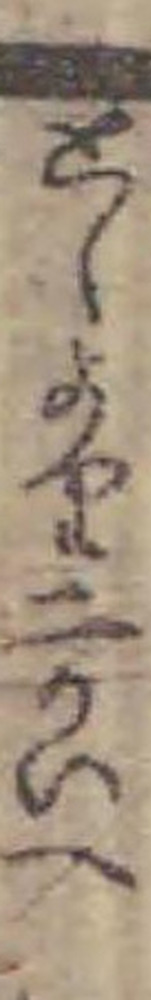としより二かいへ
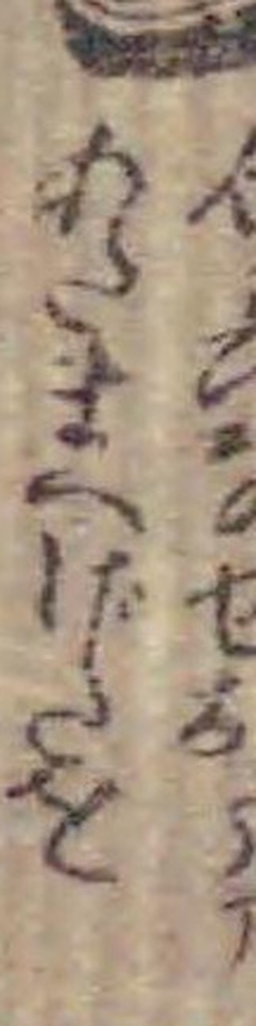あたまへげたを
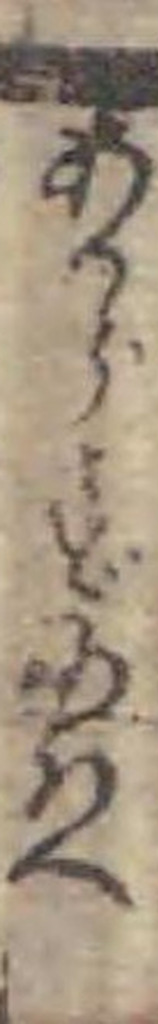あからずにはへ
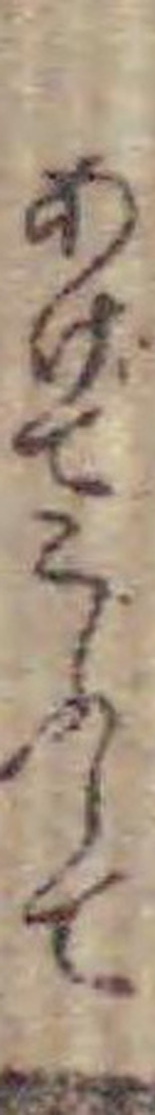あげてこふして
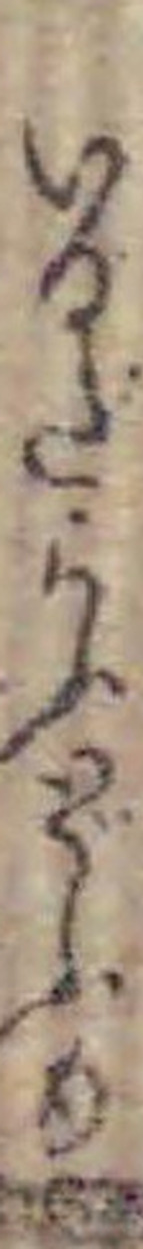いるだらふどふも
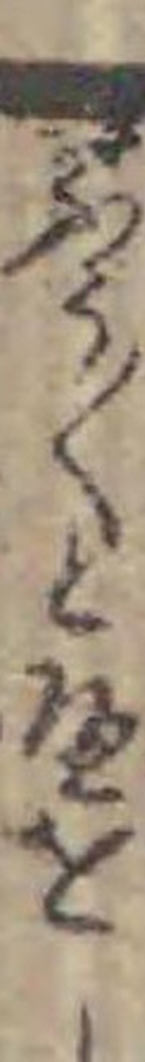ぶら〳〵とへを
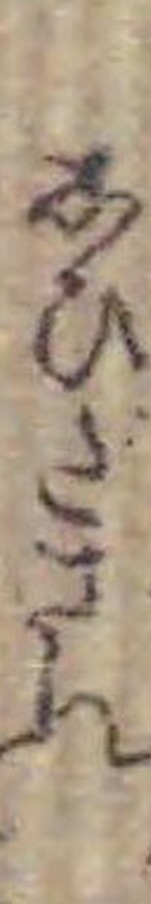思ひだされ
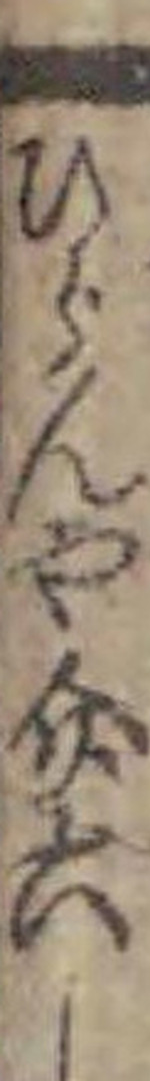ひらんや介六
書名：年寄之冷水曽我 : 3巻
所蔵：国立国会図書館 National Diet Library, JAPAN
